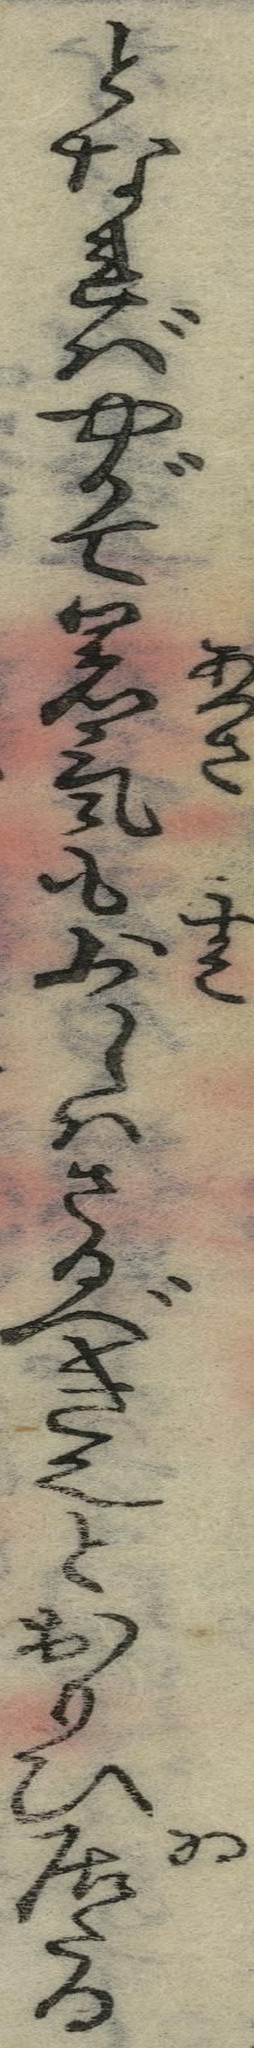となればやがて暑気も少しはさるべき也とおもひ居たる
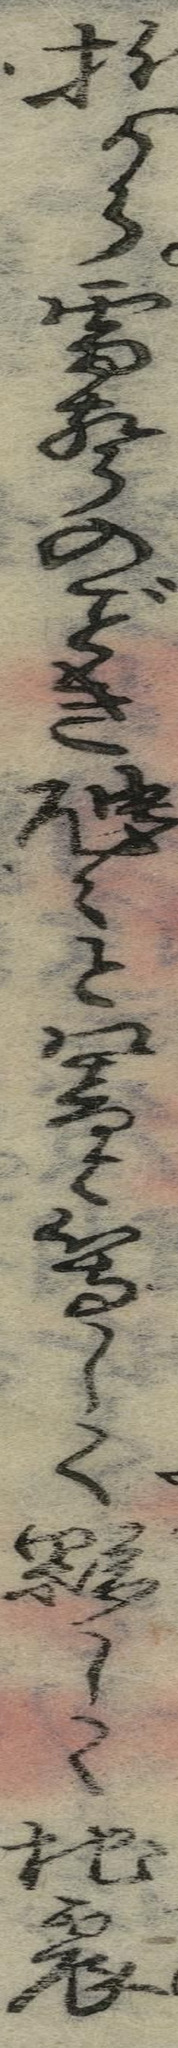折から。雷声のごとき虺々と響に等しく。夥しく地震
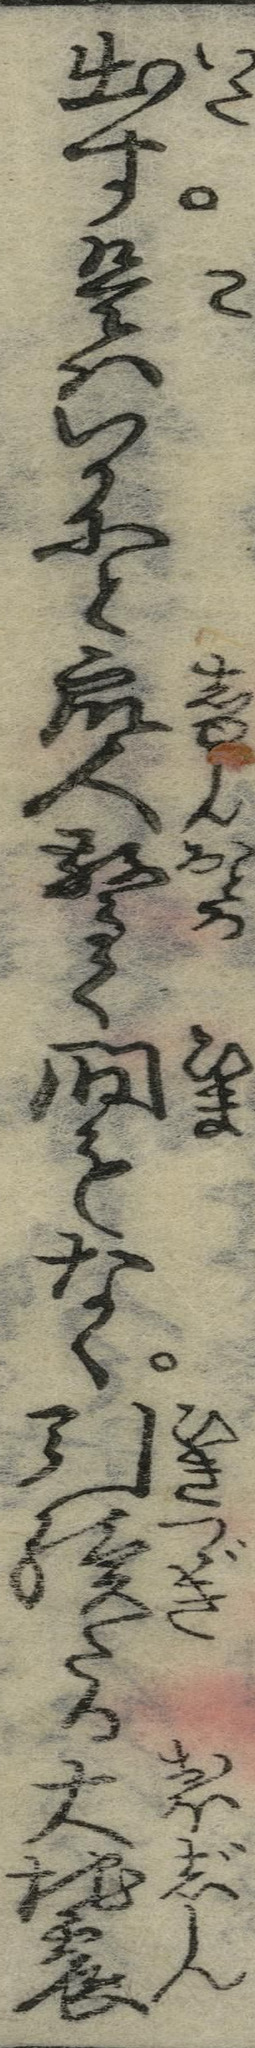出す。是はいかにと衆人驚く間もなく。引続たる大地震
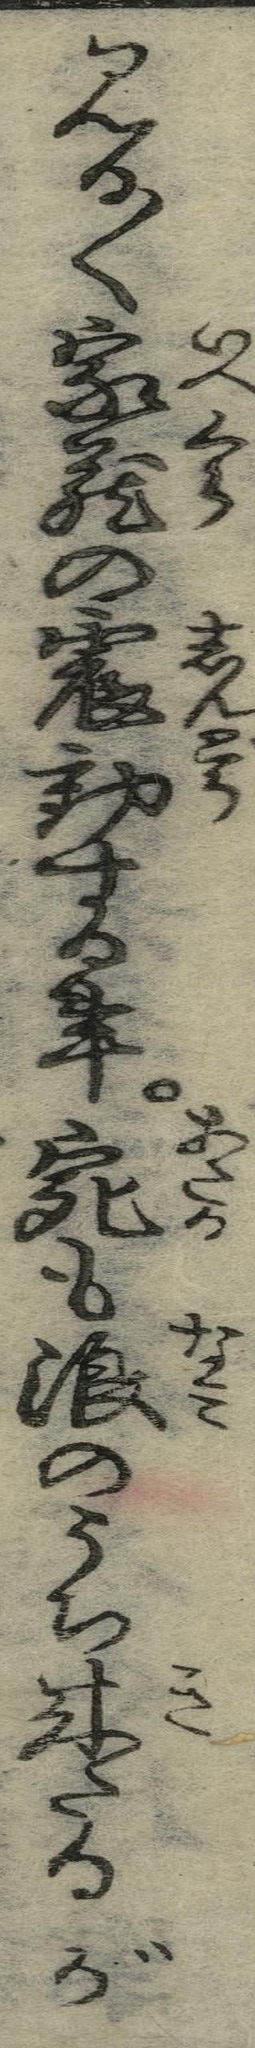みる〳〵家蔵の震動する事。宛も浪のうち来たるが
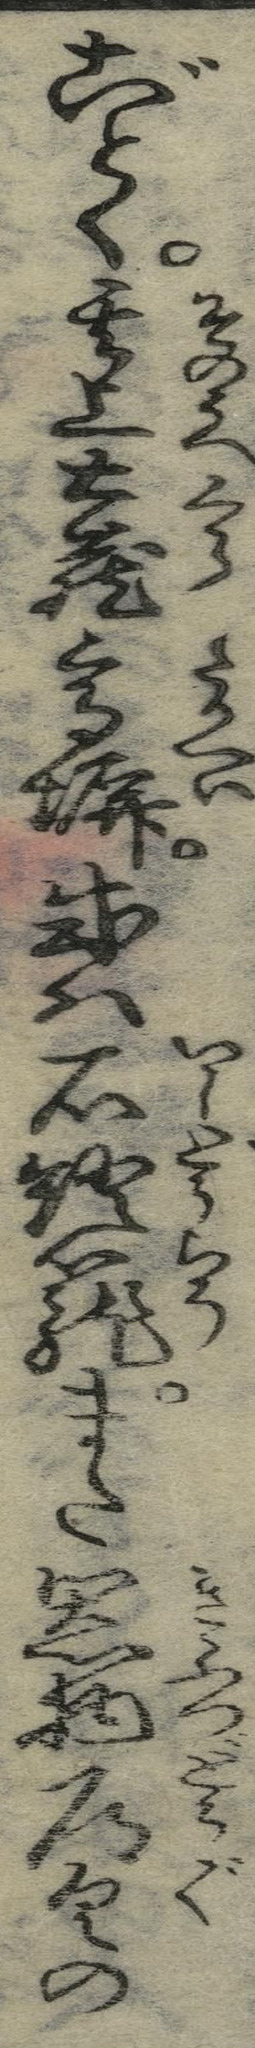ごとく。其上土蔵高塀。或は石燈篭。また器物道具の

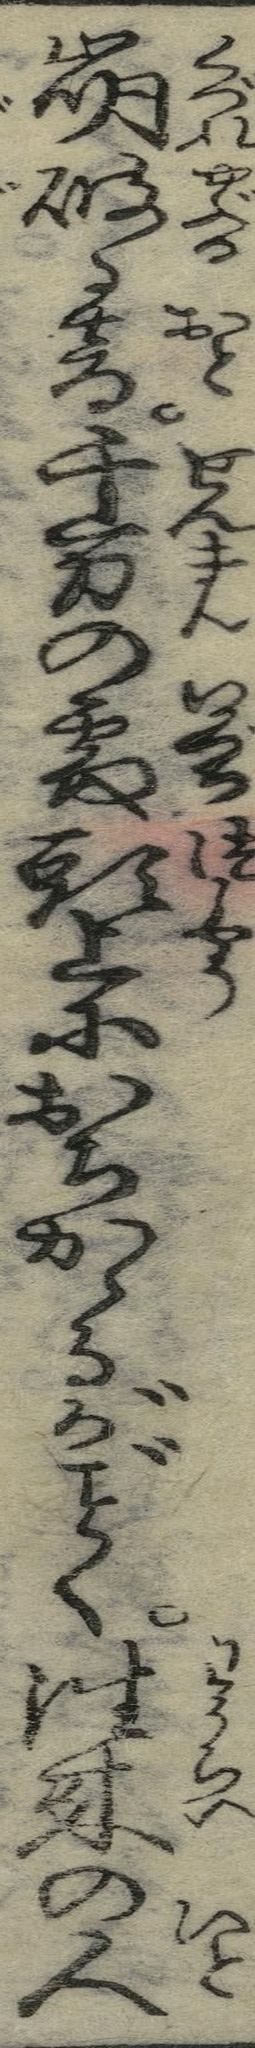崩破る音。千万の雷頭上におちかヽるがごとく。往来の人
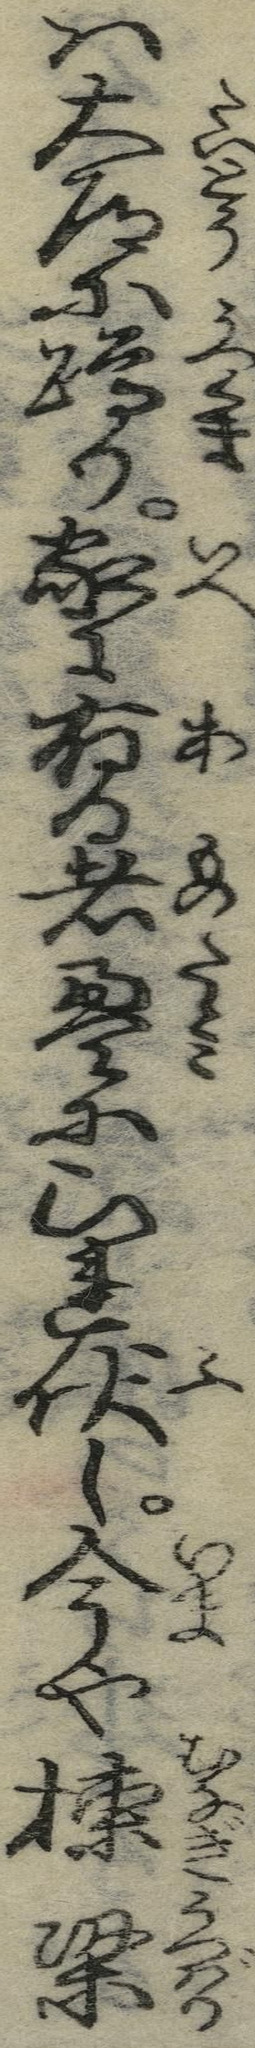は大道に蹲り。家に有る者畳にひれ伏し。今や棟梁
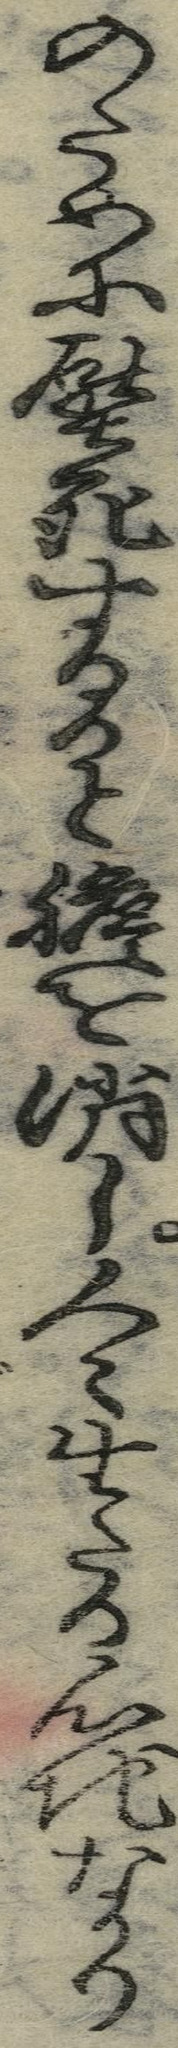のために。圧死すると膽を消し。人〻生たる心地なかり
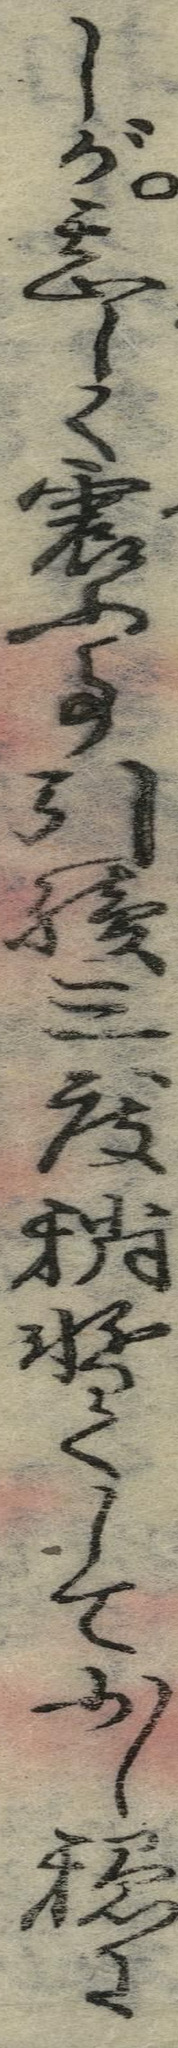しが。甚しく震ふ事引続三度。稍暫くして少し穏に
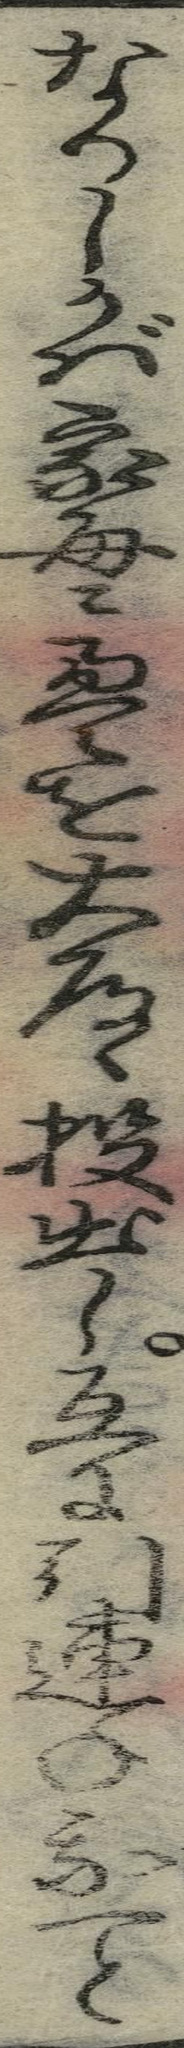なりしかば。家毎に畳を大道に投出し。互に引連ね我一と
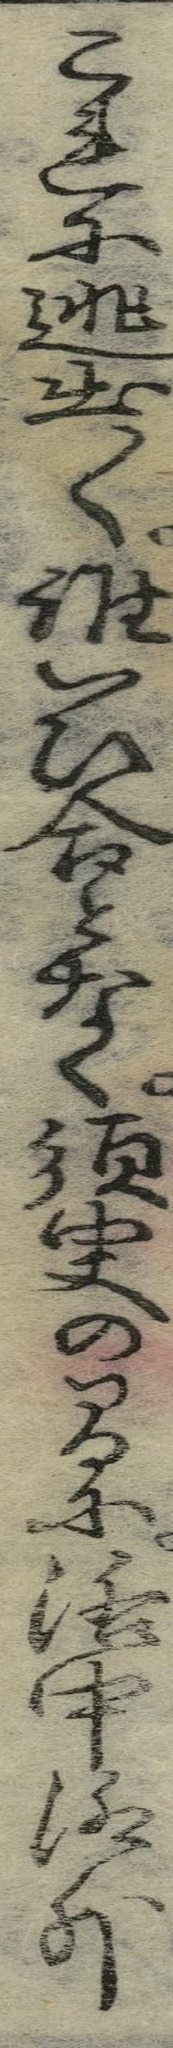これに逃出〳〵。誰いひ合となく。須臾の間に。洛中洛外の
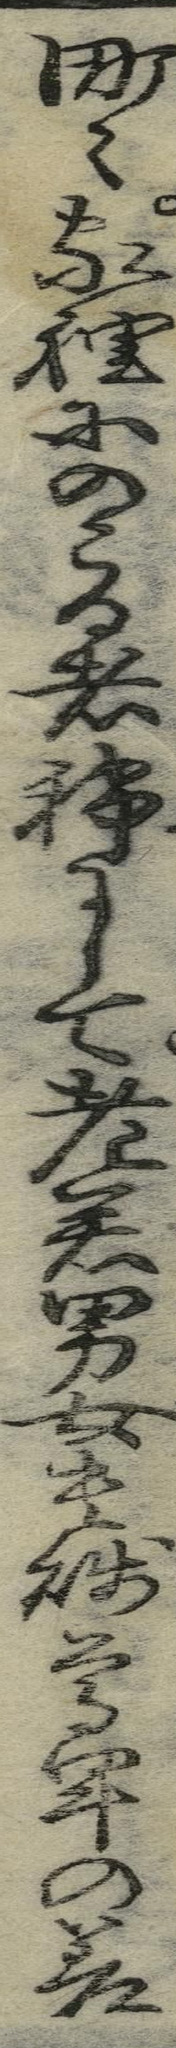町々。家裡にのこる者稀にして。老若男女貴賤尊卑の差
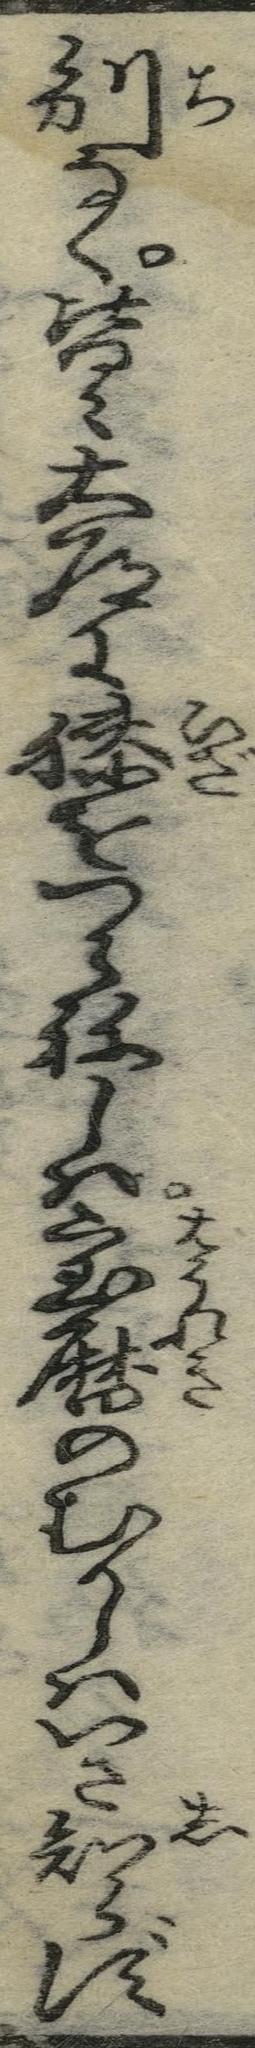別なく。皆々大道に膝をつらねしは。宝暦のむかしはいさ知らず
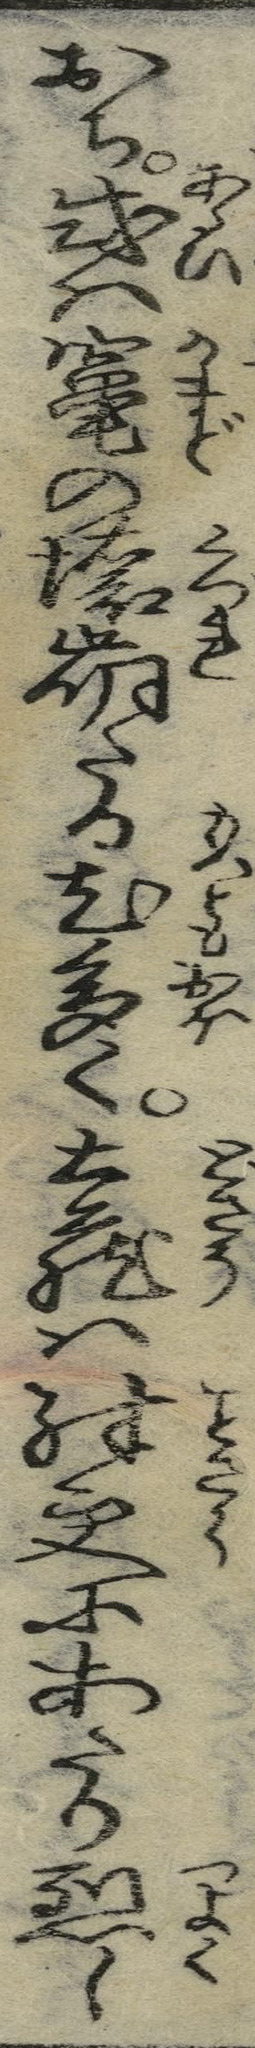おち。或は竈の壊崩たる尤多く。土蔵は殊更にあたり烈〳〵
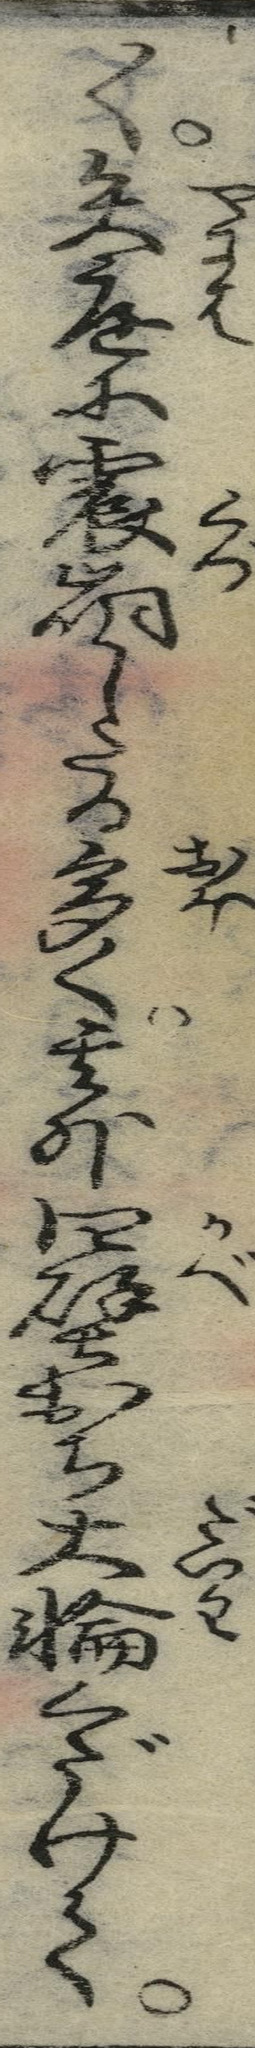く。矢庭に震崩したる多く。其外四壁おち大輪くだけて。
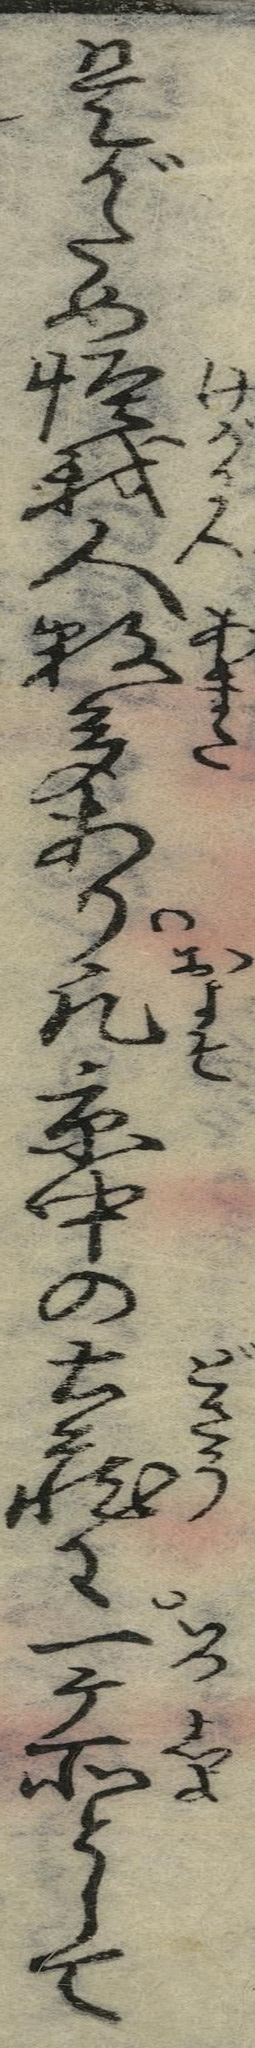是がため怪我人数多あり。凡京中の土蔵に。一ヶ所として
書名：本朝地震記　全
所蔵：東京大学地震研究所図書室 Earthquake Research Institute Library, The University of Tokyo, JAPAN
